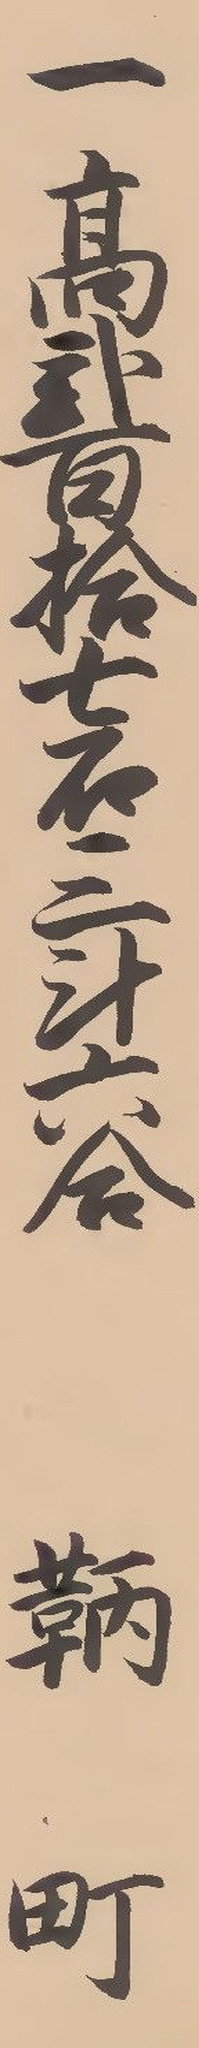一高弐百拾七石三斗六合鞆町
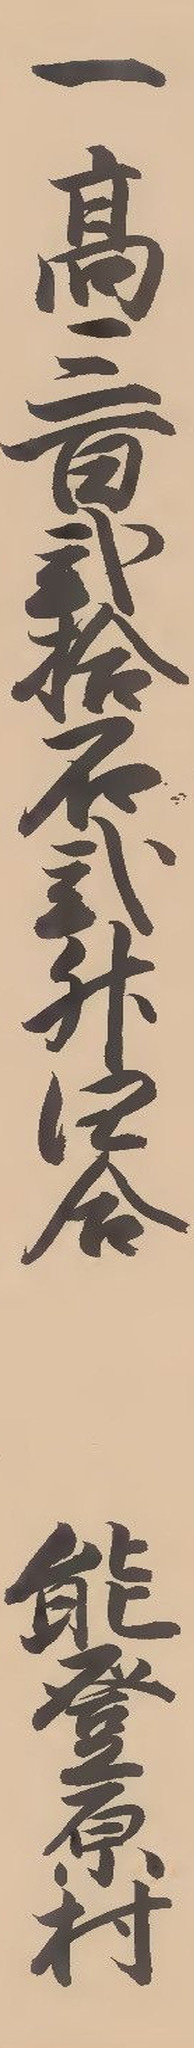一高三百弐拾石弐升四合能登原村
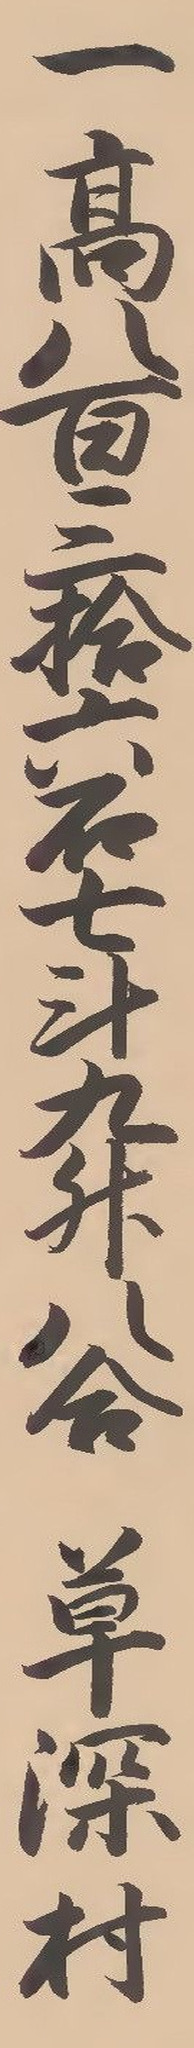一高八百三拾六石七斗九升八合草深村
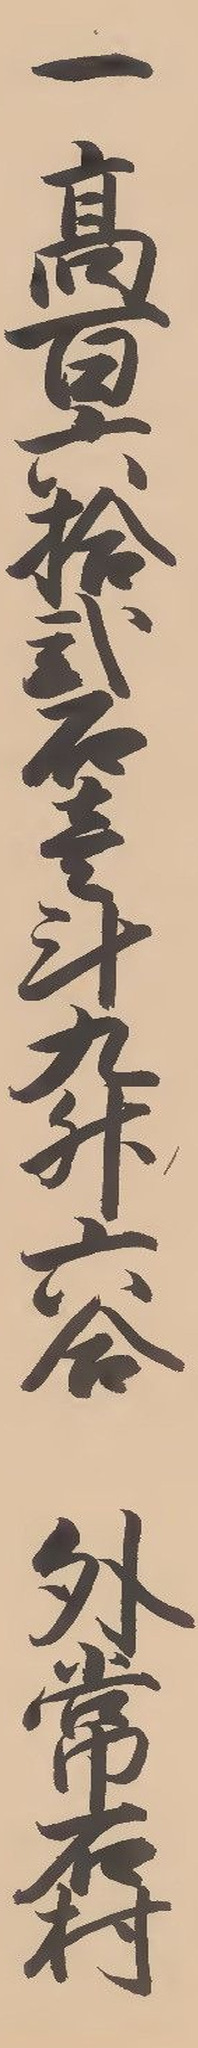一高百六拾弐石壱斗九升六合外常石村
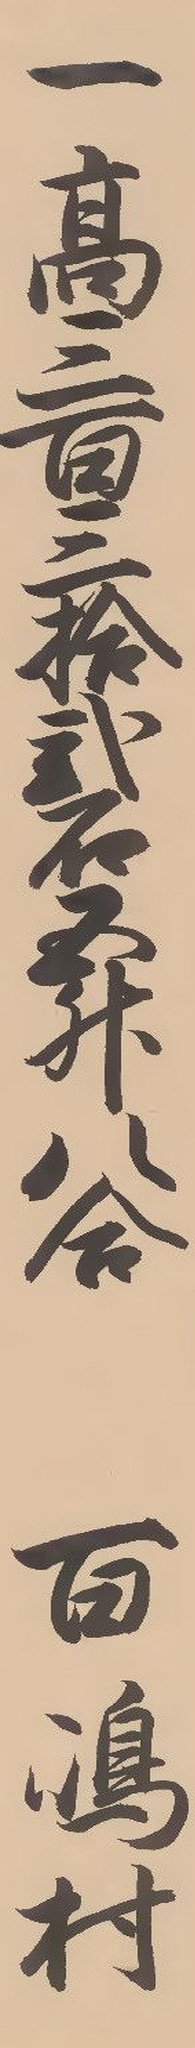一高三百三拾弐石五升八合百島村
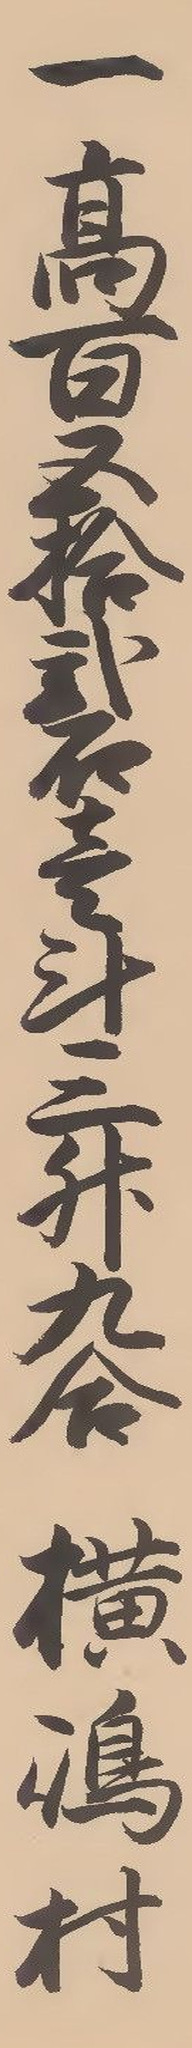一高百五拾弐石壱斗三升九合横島村
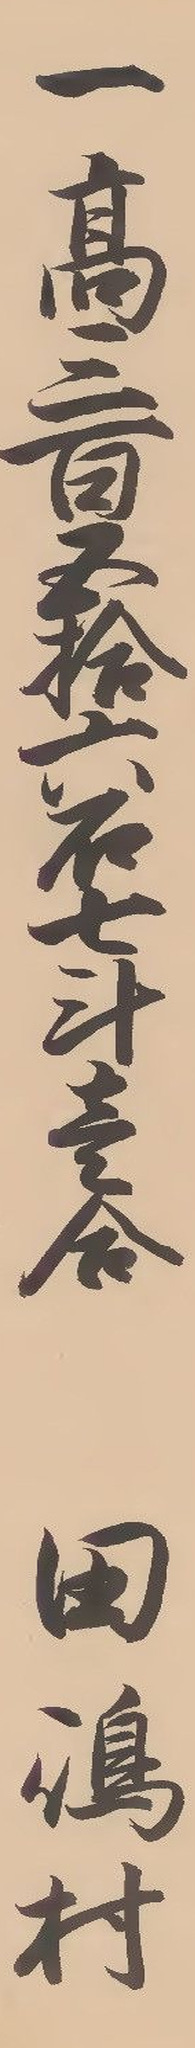一高三百五拾六石七斗壱合田島村

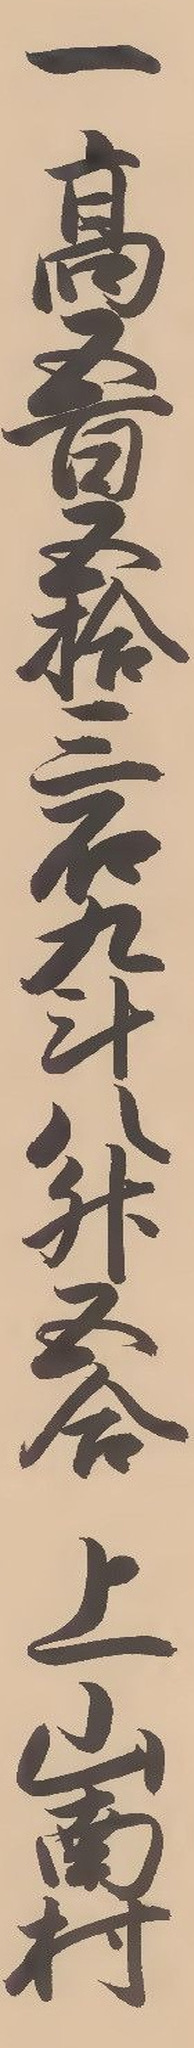一高五百五拾三石九斗八升五合上山南村
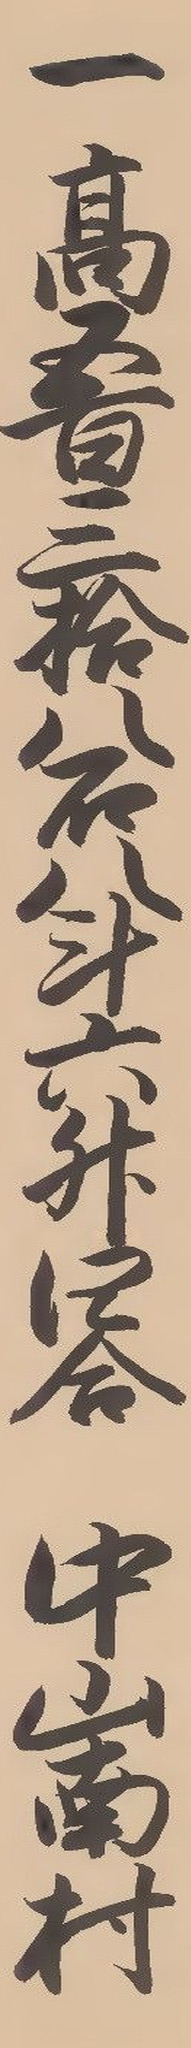一高五百三拾八石八斗六升四合中山南村
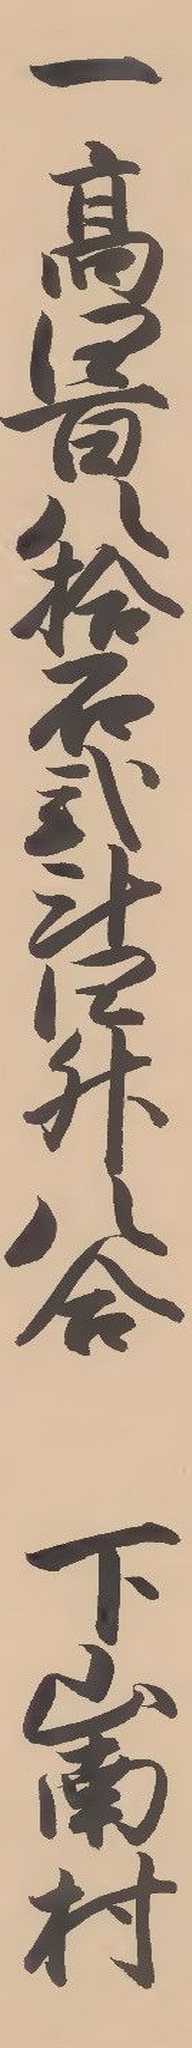一高四百八拾石弐斗四升八合下山南村
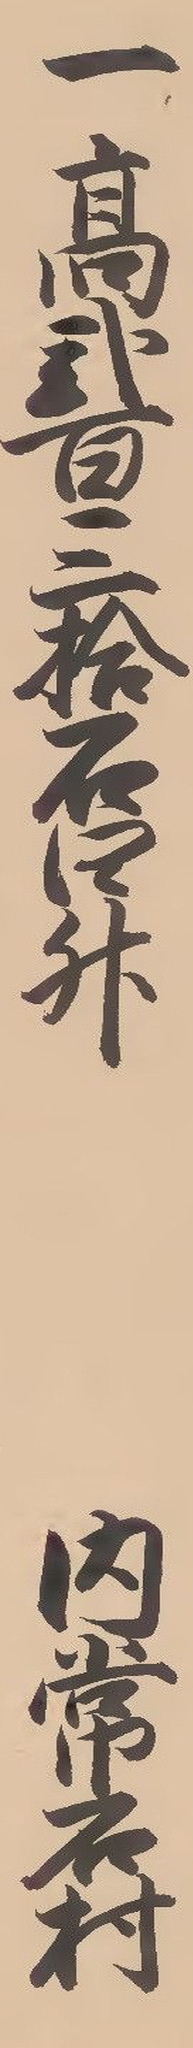一高弐百三拾石四升内常石村
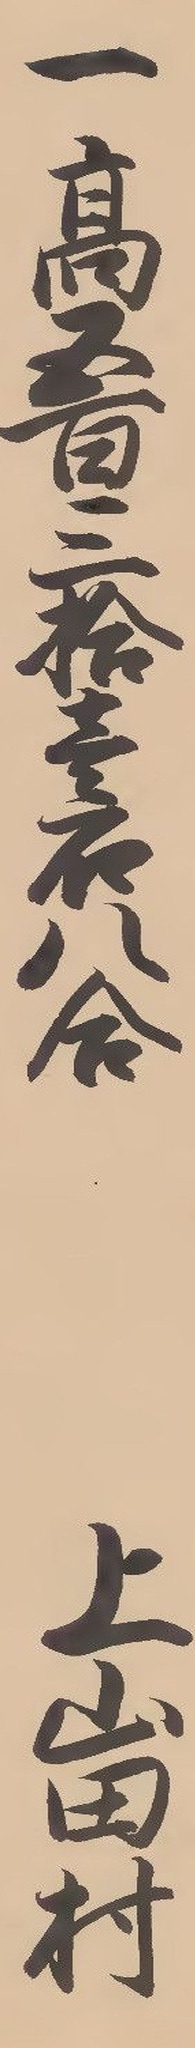一高五百三拾壱石八合上山田村
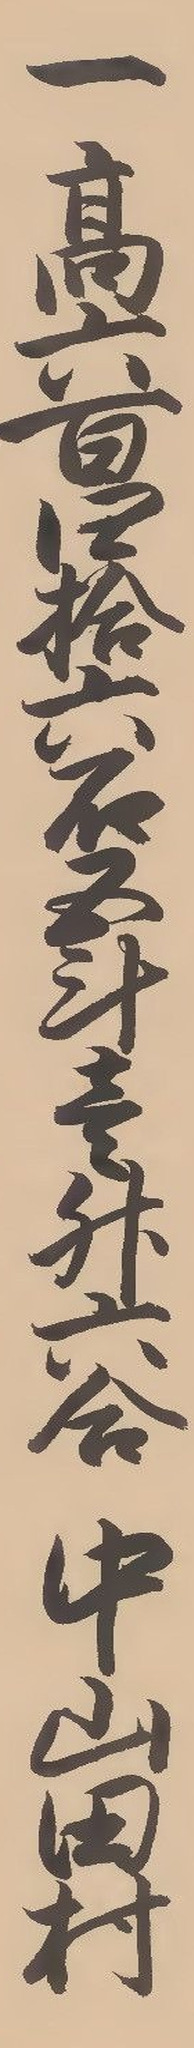一高六百四拾六石五斗壱升六合中山田村
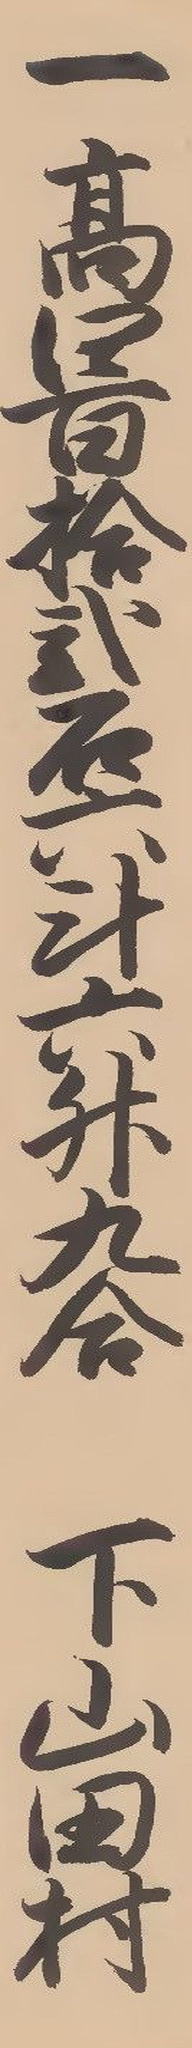一高四百拾弐石六斗六升九合下山田村
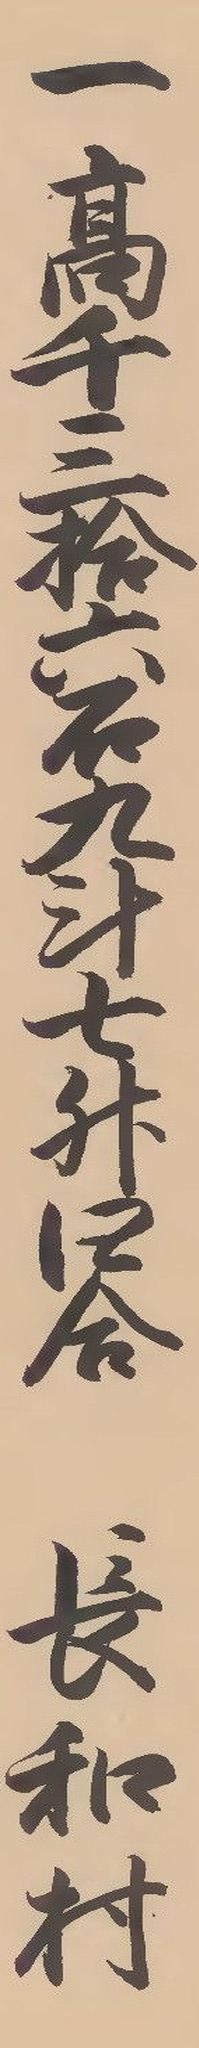一高千三拾六石九斗七升四合長和村

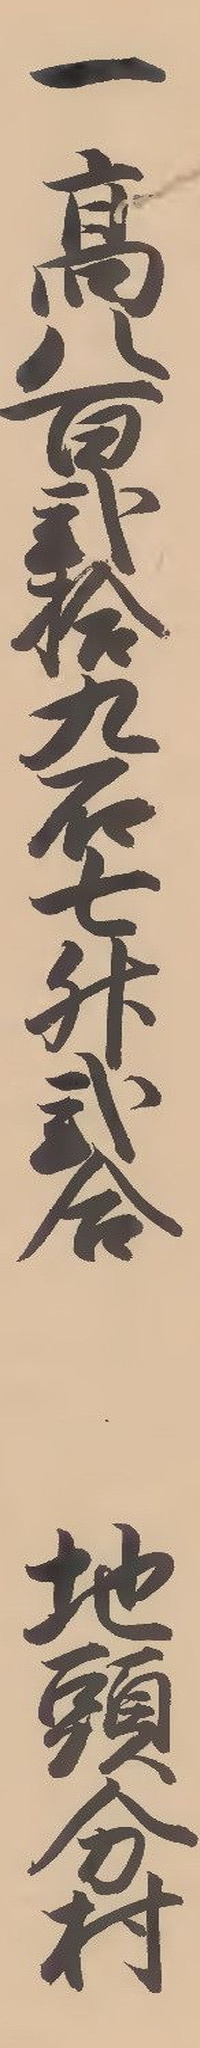一高八百弐拾九石七升弐合地頭分村
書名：備後国郷帳
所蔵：国立公文書館 National Archives of Japan
